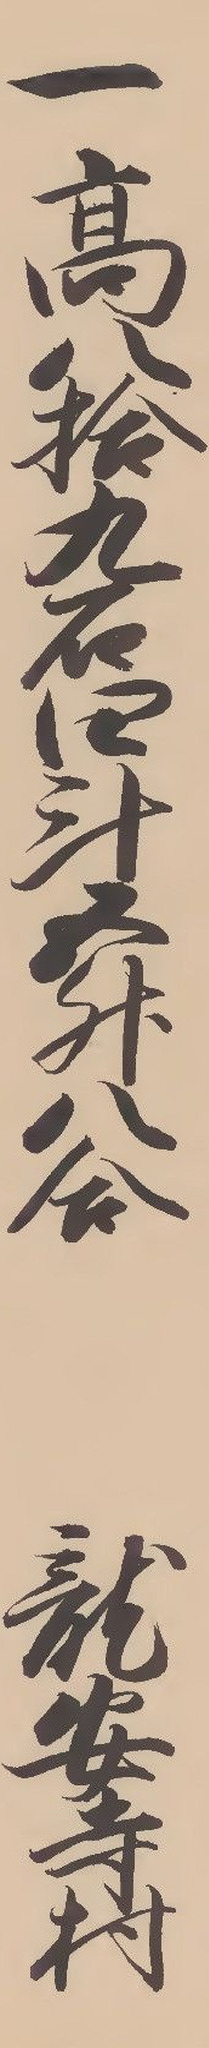一高八拾九石四斗五升八合竜安寺村
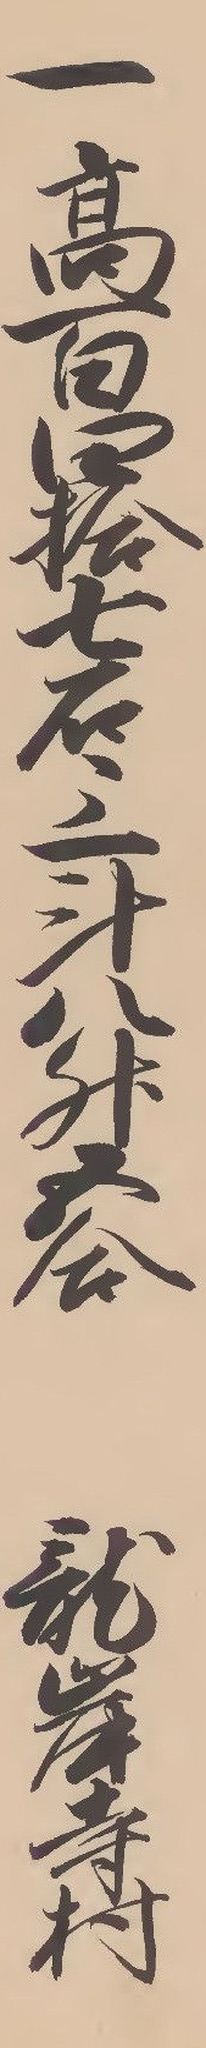一高百四拾七石三斗八升五合竜岸寺村

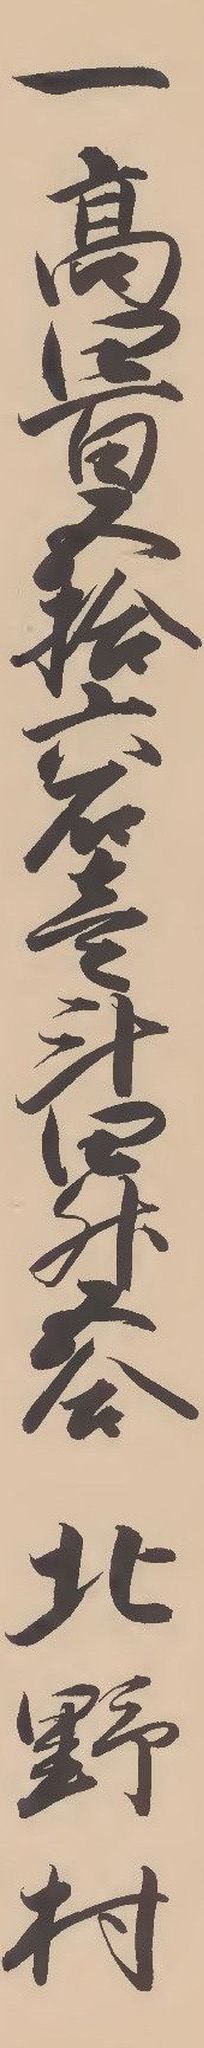一高四百五拾六石壱斗四升五合北野村
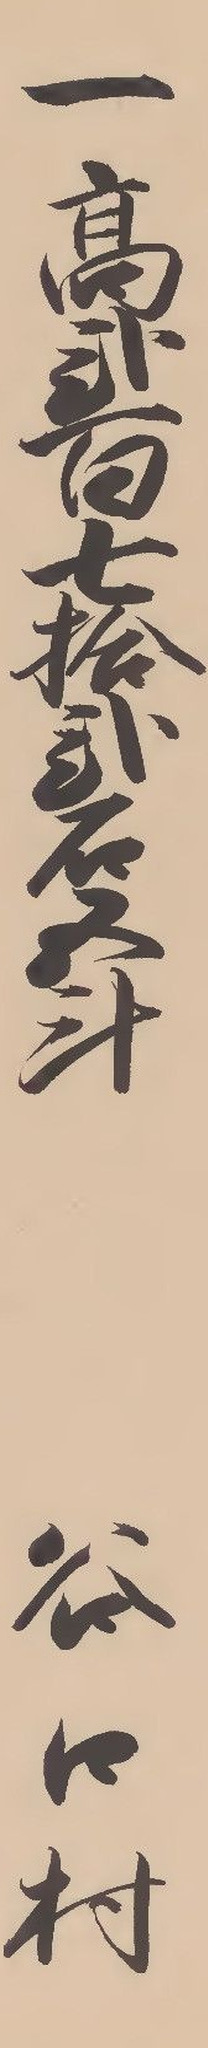一高弐百七拾弐石五斗谷口村
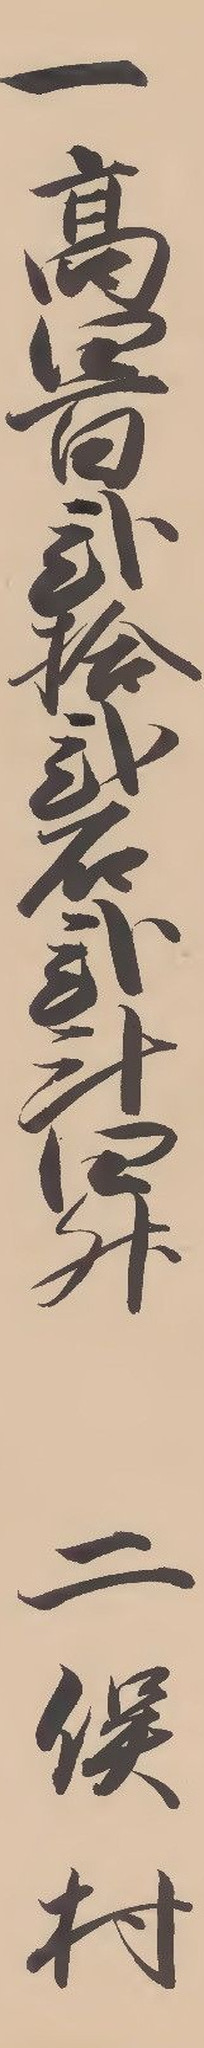一高四百弐拾弐石弐斗四升二俣村
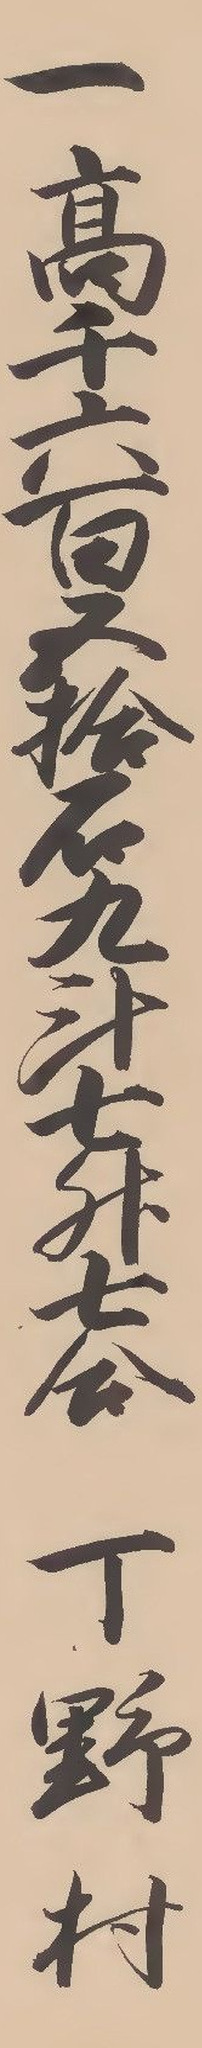一高千六百五拾石九斗七升七合丁野村
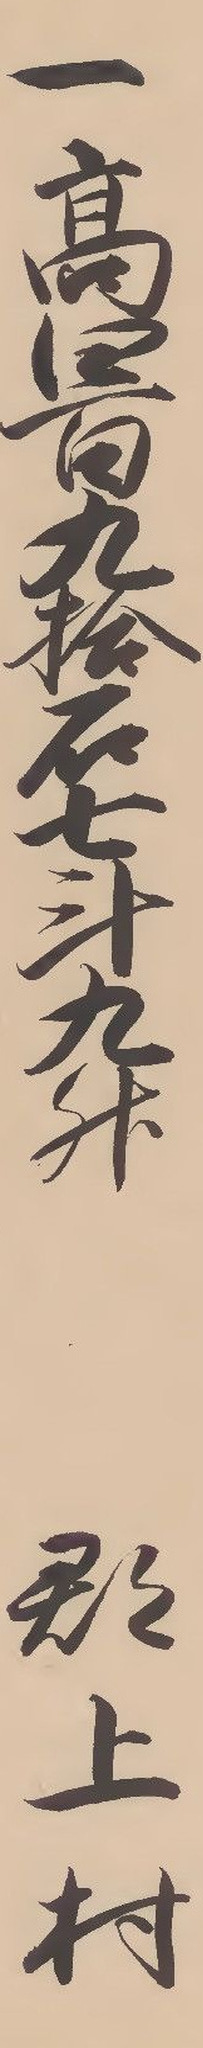一高四百九拾石七斗九升郡上村
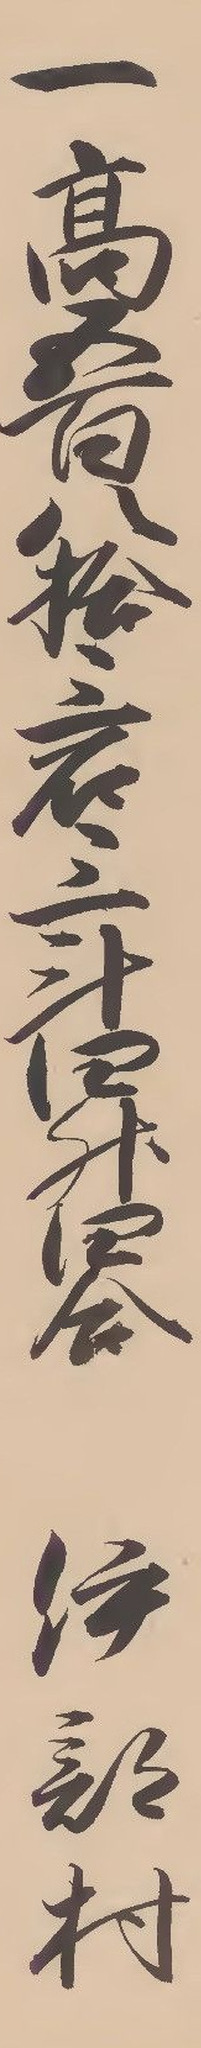一高五百八拾三石三斗四升四合伊部村

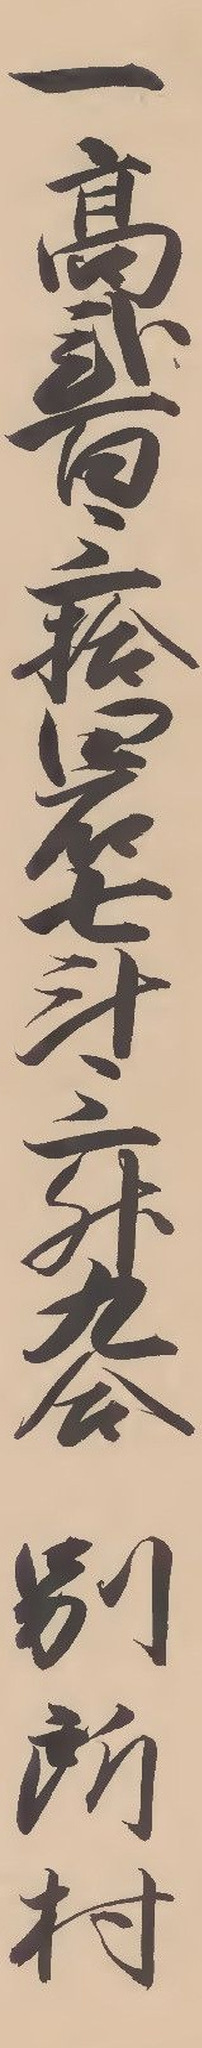一高弐百三拾四石七斗三升九合別所村
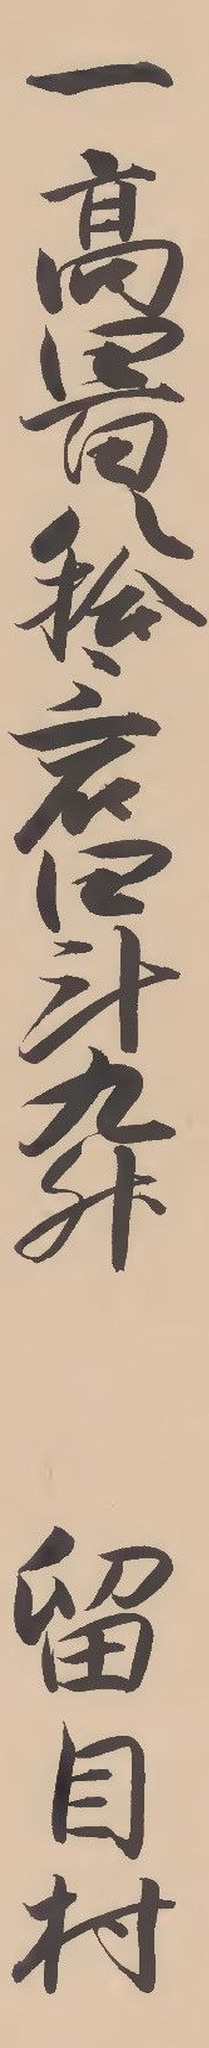一高四百八拾三石四斗九升留目村
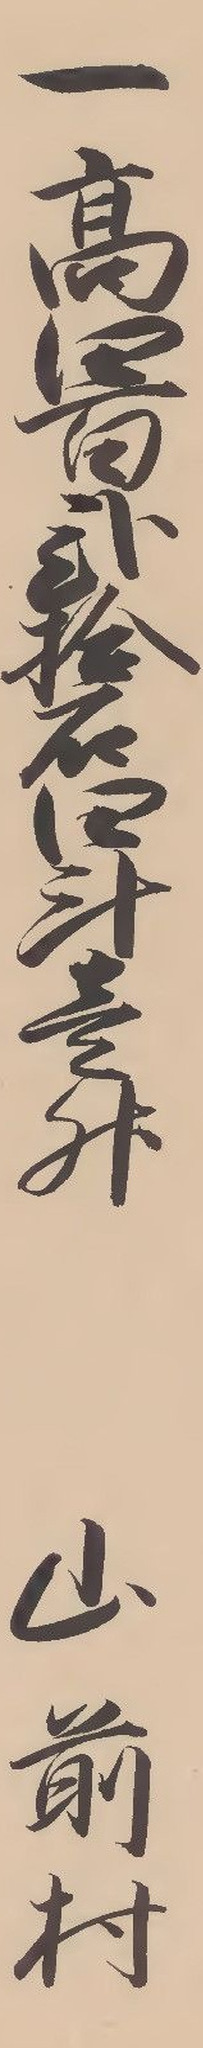一高四百弐拾石四斗壱升山前村
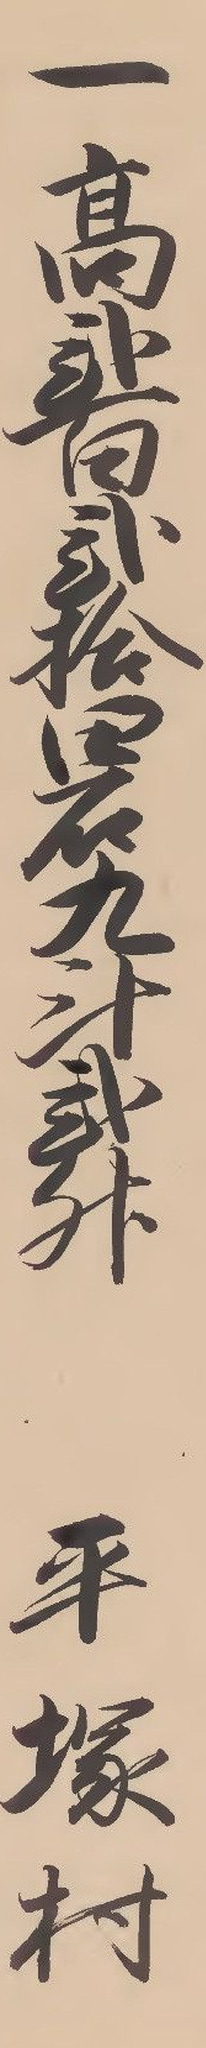一高弐百弐拾四石九斗弐升平塚村
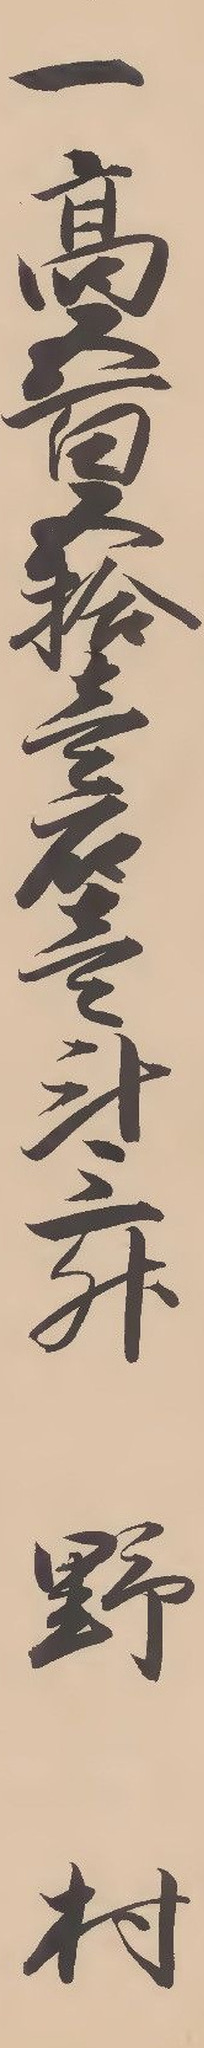一高五百五拾壱石壱斗三升野村
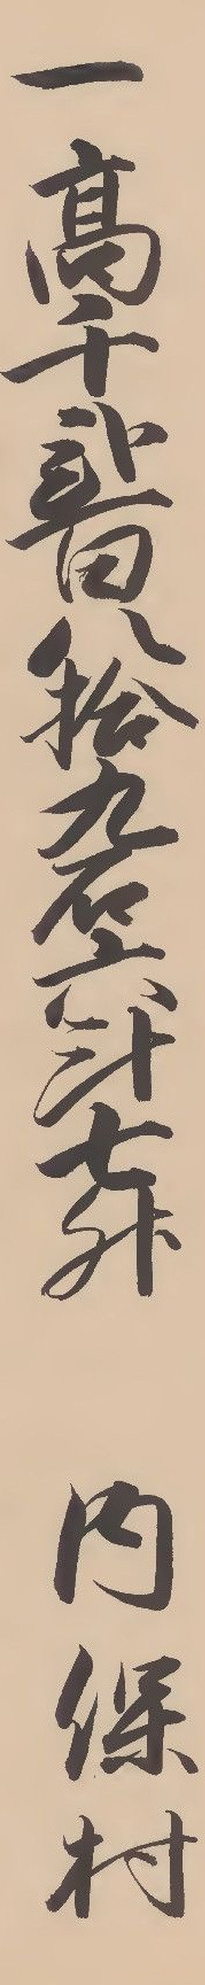一高千弐百八拾九石六斗七升内保村
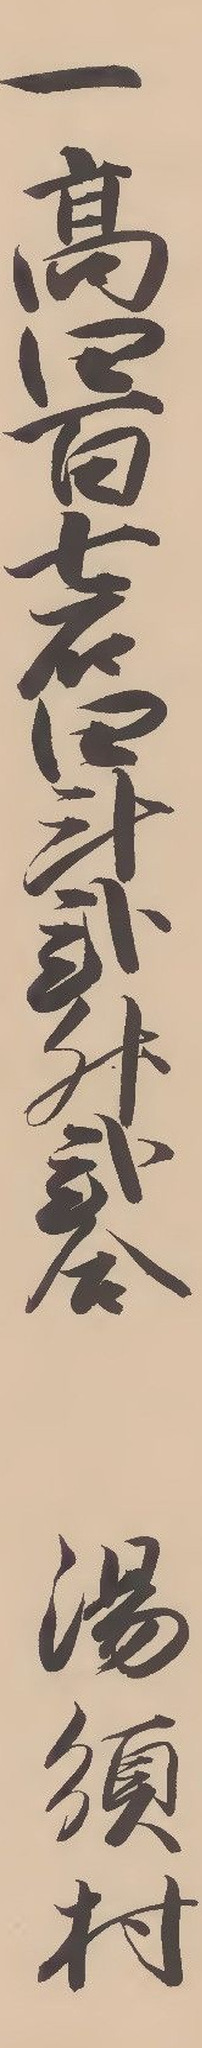一高四百七石四斗弐升弐合湯須村
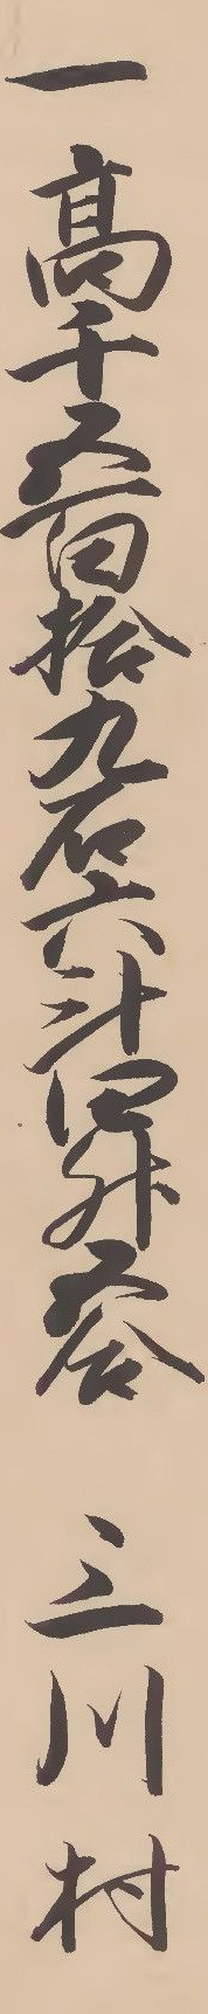一高千五百拾九石六斗四升五合三川村
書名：近江国郷帳
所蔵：国立公文書館 National Archives of Japan
